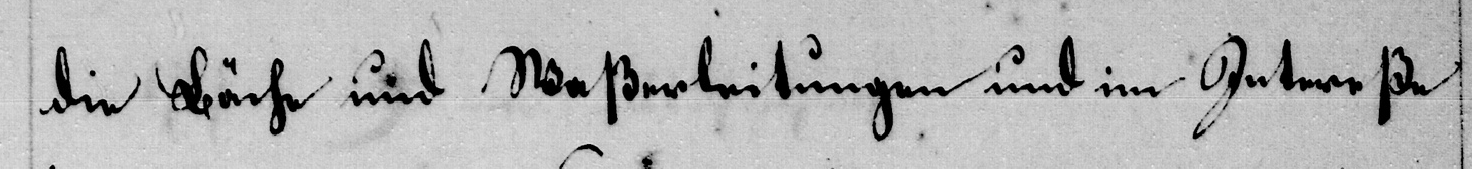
die Bäche und Waßerleitungen und im Intereße
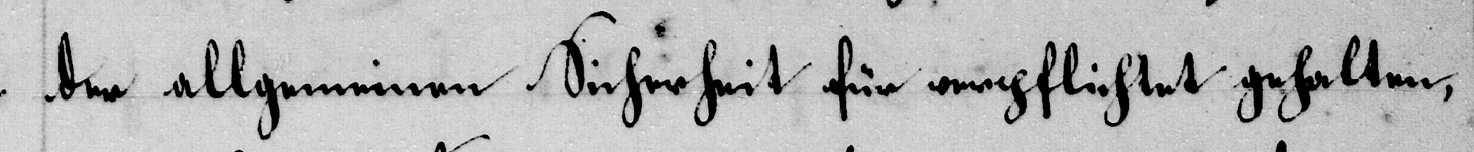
der allgemeinen Sicherheit für verpflichtet gehalten,
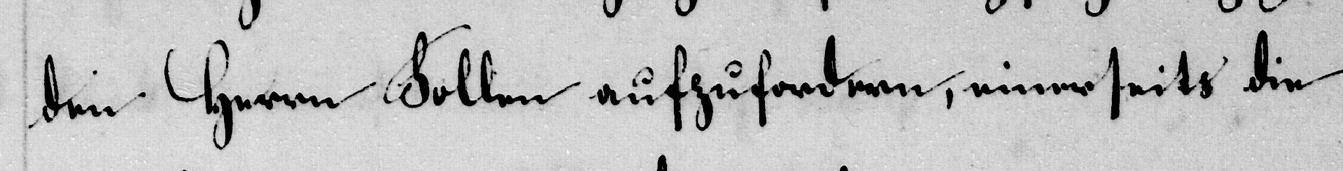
den Herrn Follen aufzufordern, einerseits die
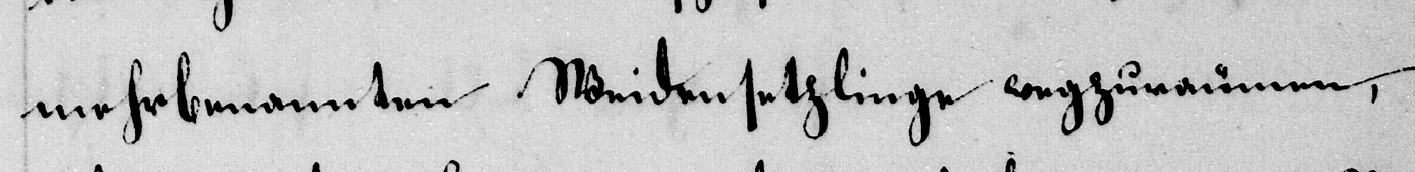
mehrbenannten Weidensetzlinge wegzuräumen,
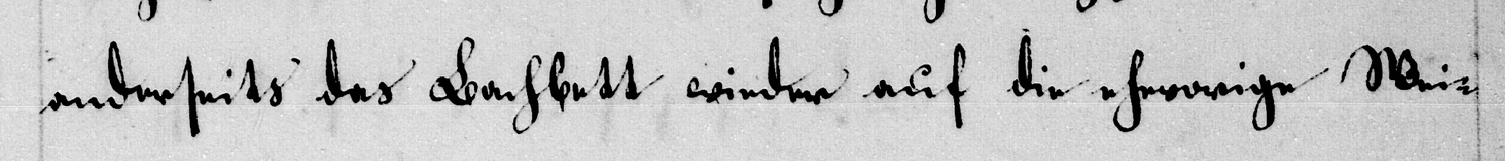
anderseits das Bachbett wieder auf die ehevorige Wei¬
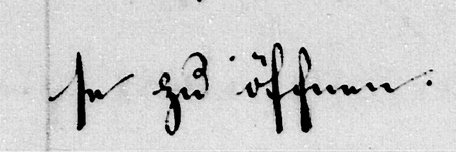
se zu öffnen.
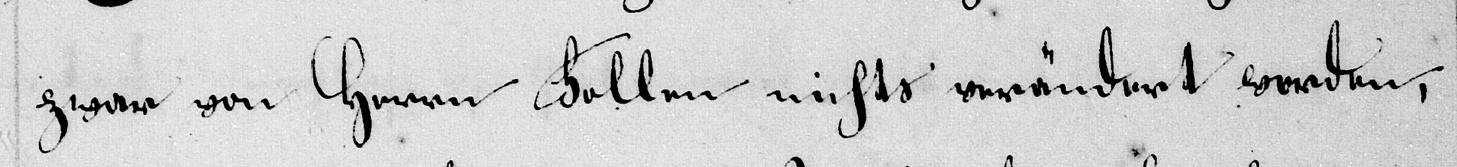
zwar von Herrn Follen nichts verändert worden,
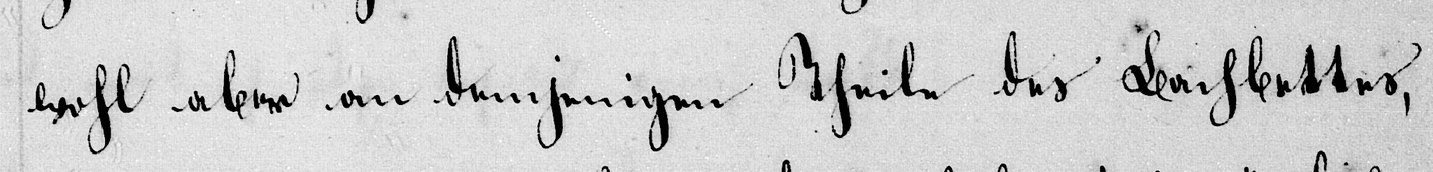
wohl aber an demjenigen Theile des Bachbettes,
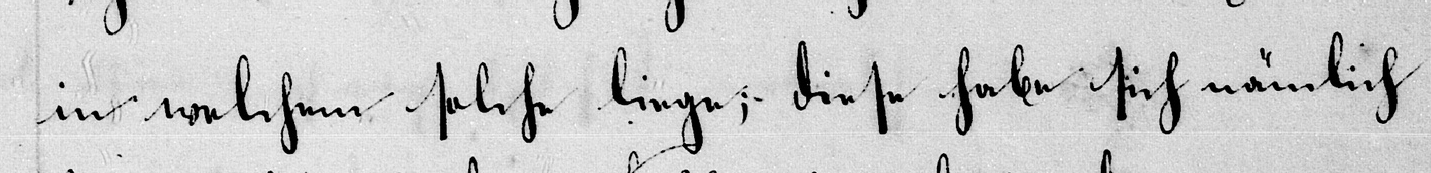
in welchem solche liege; diese habe sich nämlich
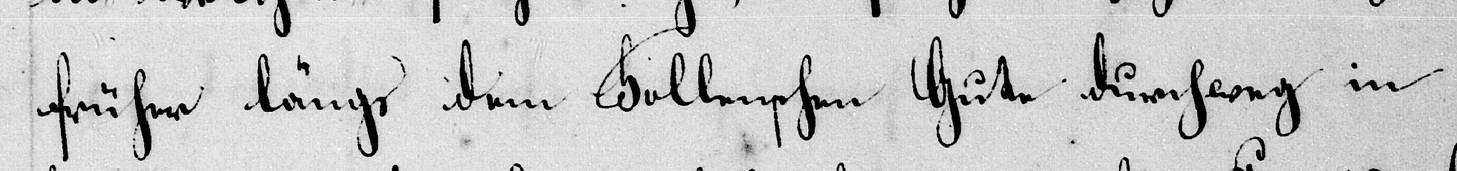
früher längs dem Follenschen Gute durchweg in
